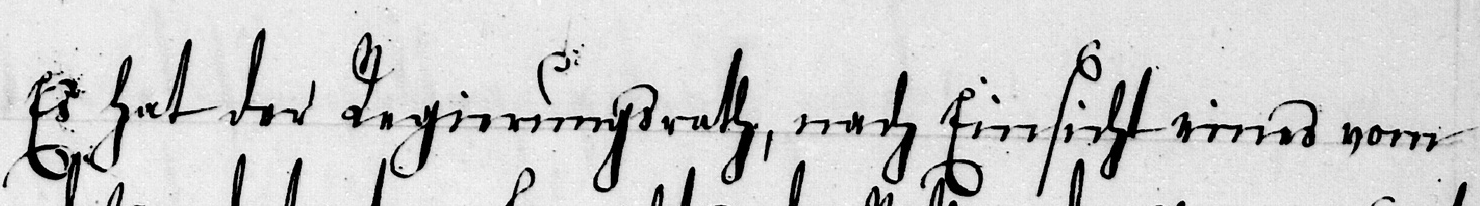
Es hat der Regierungsrath, nach Einsicht eines vom
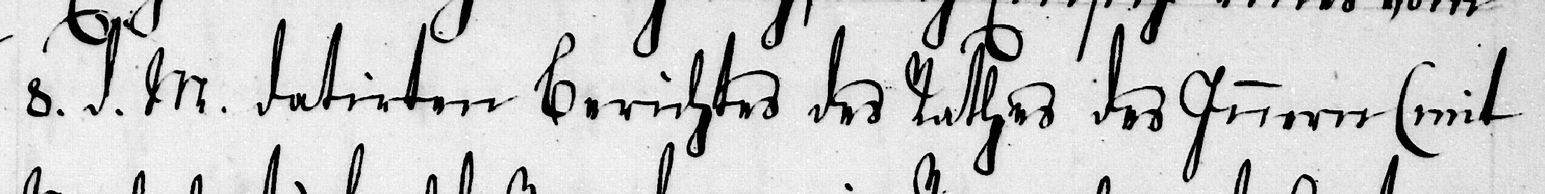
8. d. M. datirten Berichtes des Rathes des Innern (mit
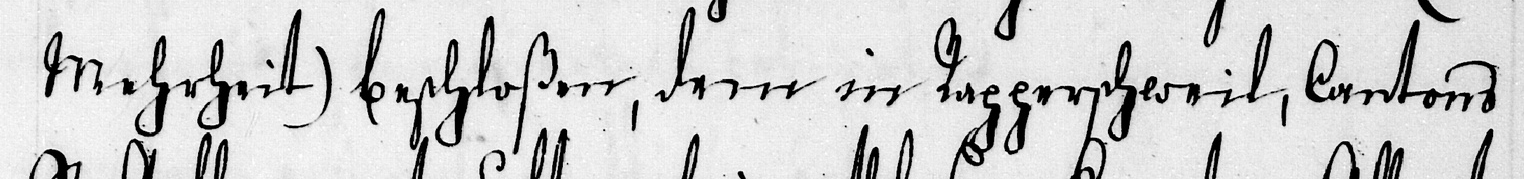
Mehrheit) beschloßen, dem in Rapperschweil, Cantons
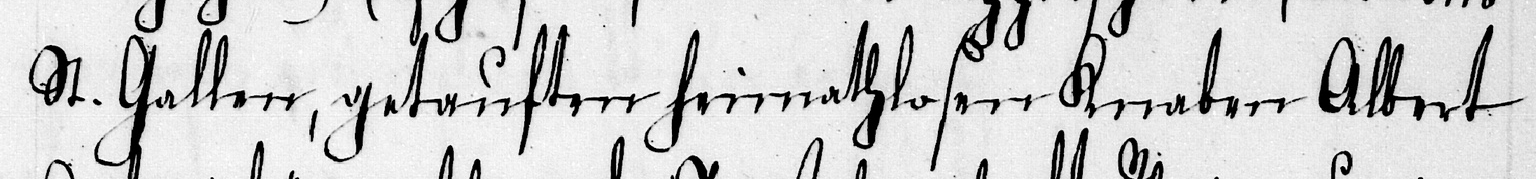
St. Gallen, getauften heimathlosen Knaben Albert
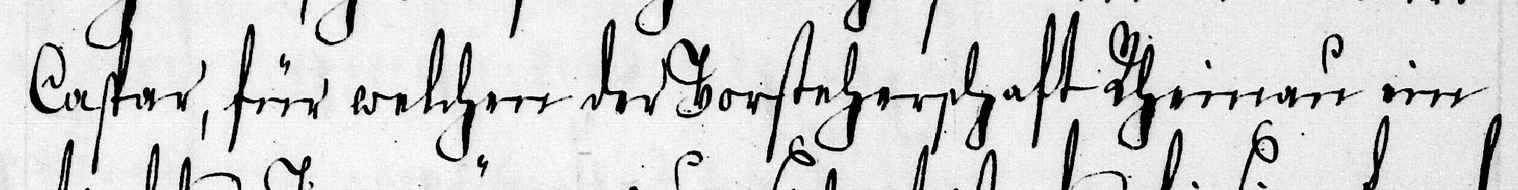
Caspar, für welchen der Vorsteherschaft Rheinau ein
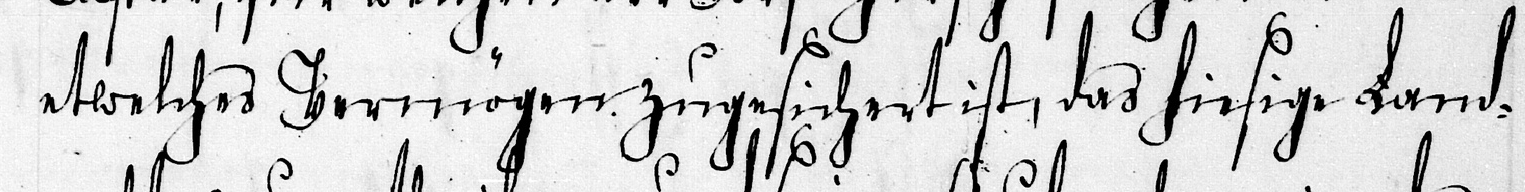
etwelches Vermögen zugesichert ist, das hiesige Land¬
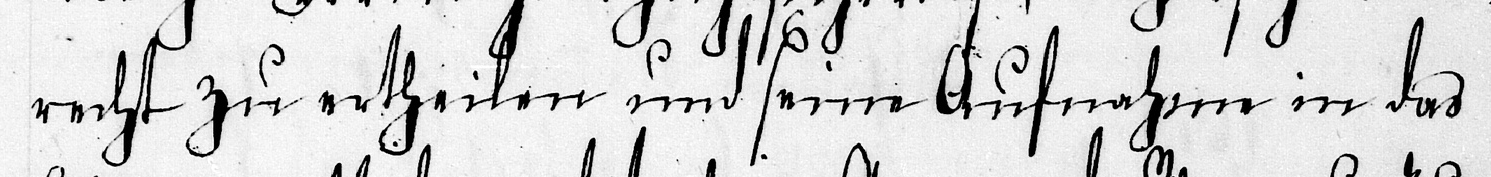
recht zu ertheilen und seine Aufnahme in das
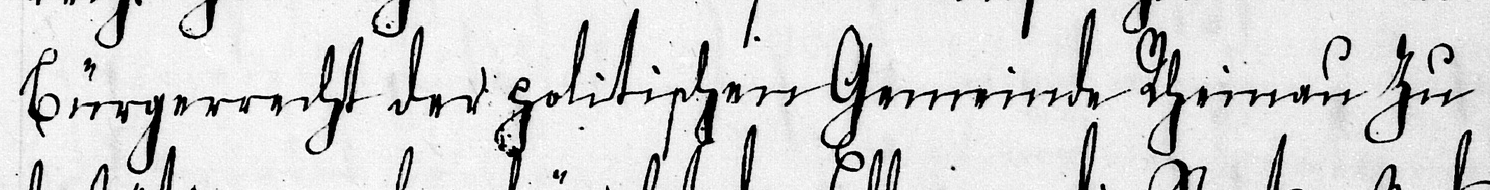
Bürgerrecht der politischen Gemeinde Rheinau zu
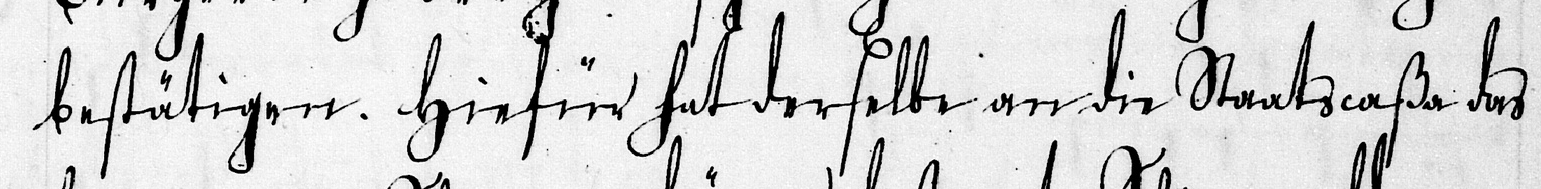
bestätigen. Hiefür hat derselbe an die Staatscaßa das
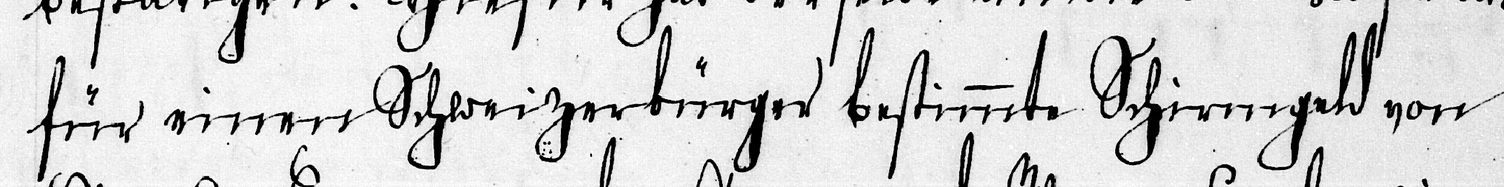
für einen Schweizerbürger bestimmte Schirmgeld von
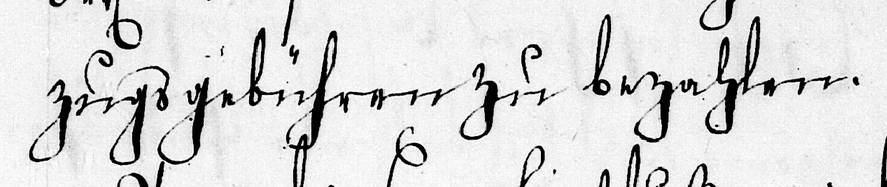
zugsgebühren zu bezahlen.
